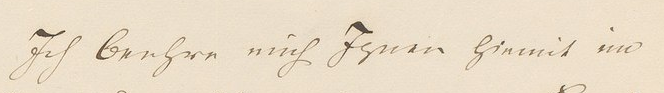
Ich beehre mich Ihnen hiemit im
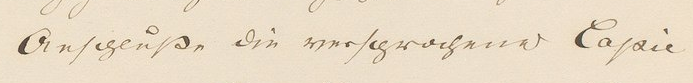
Anschluße die versprochene Copie
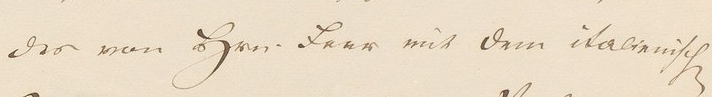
des von Herr Feer mit dem italienischen
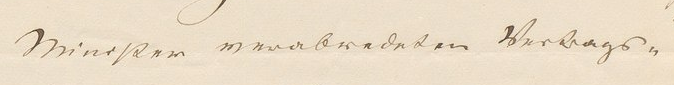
Minister verabredeten Vertrags-
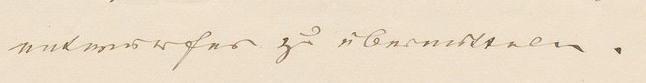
entwurfes zu übermitteln.
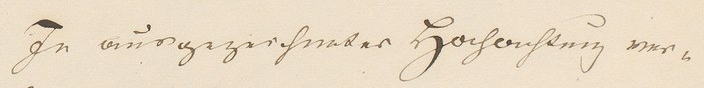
In ausgezeichneter Hochachtung ver-
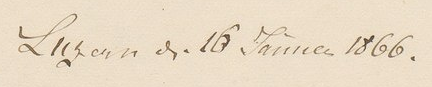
Luzern d. 16. Jänner 1866.
